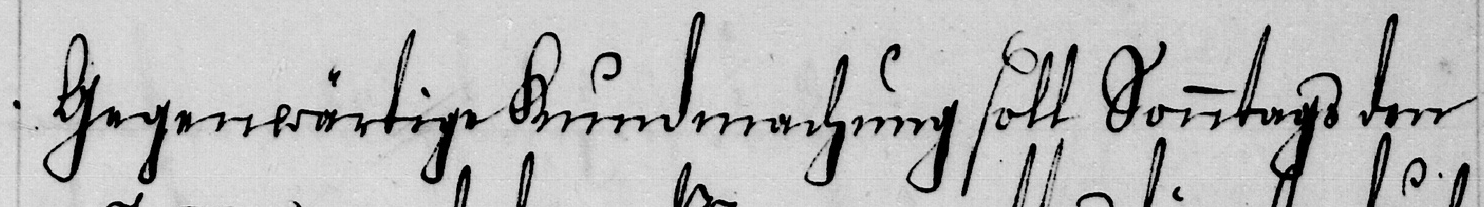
Gegenwärtige Kundmachung soll Sonntags den
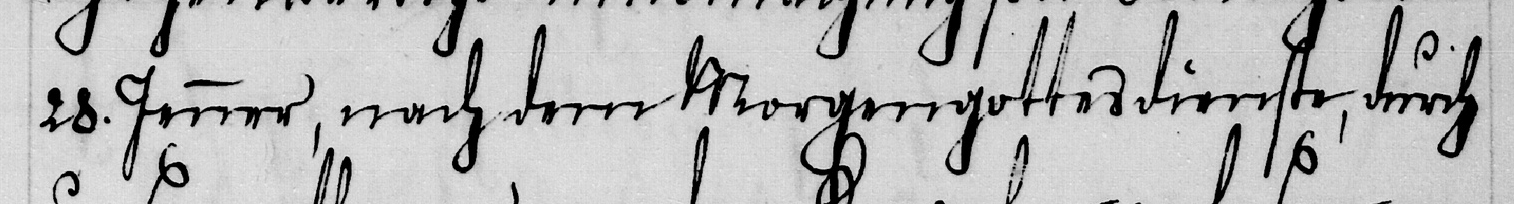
28. Jenner, nach dem Morgengottesdienste, durch
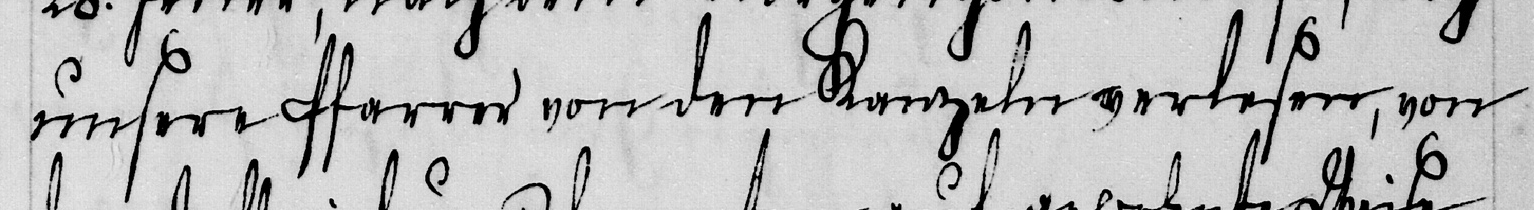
unsere Pfarrer von den Kanzeln verlesen, von
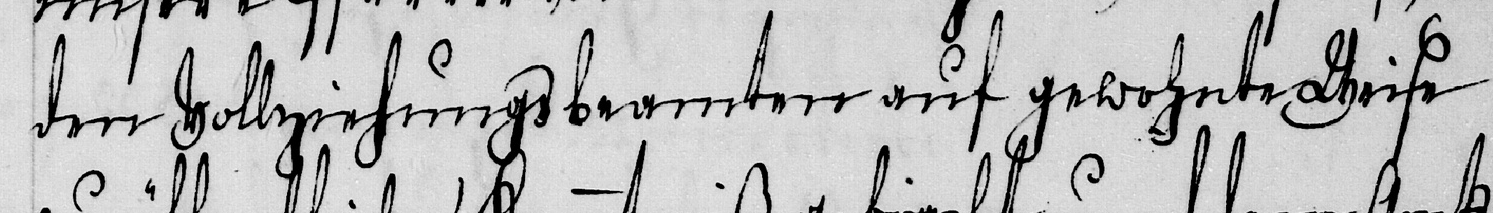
den Vollziehungsbeamten auf gewohnte Weise
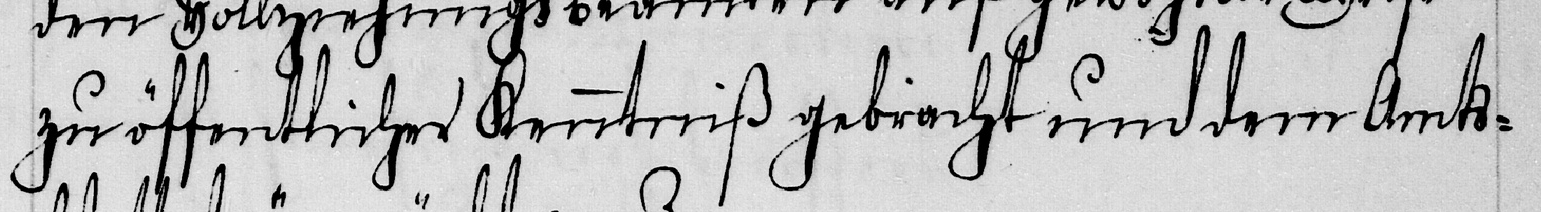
zu öffentlicher Kenntiß gebracht und dem Amts¬
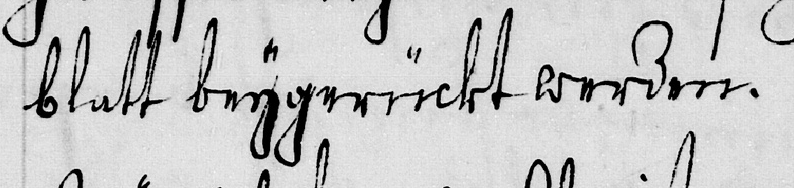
blatt beygerückt werden.
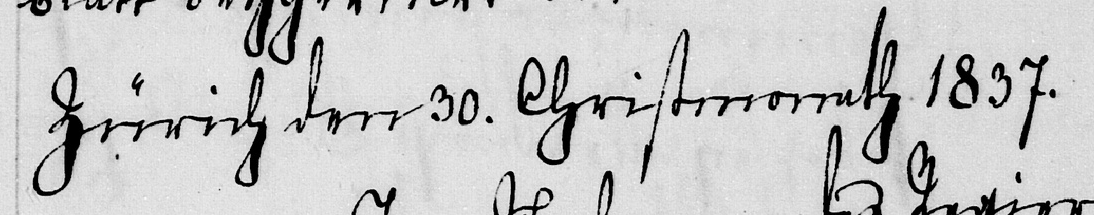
Zürich den 30. Christmonath 1837.
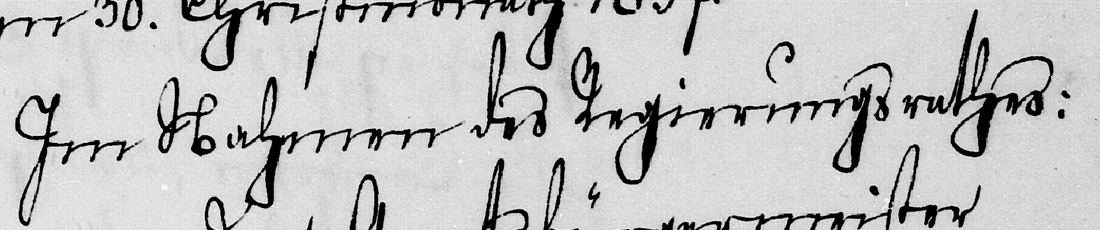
Im Nahmen des Regierungsrathes:
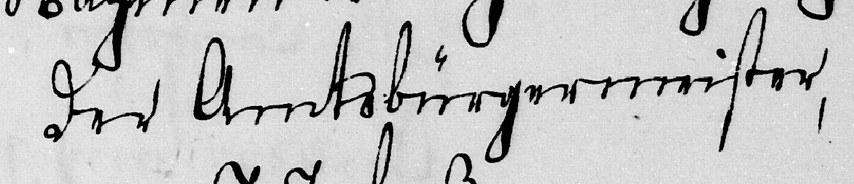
Der Amtsbürgermeister,
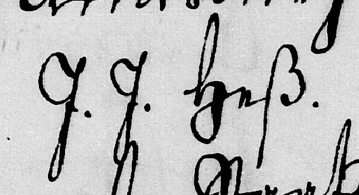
J. J. Heß.
